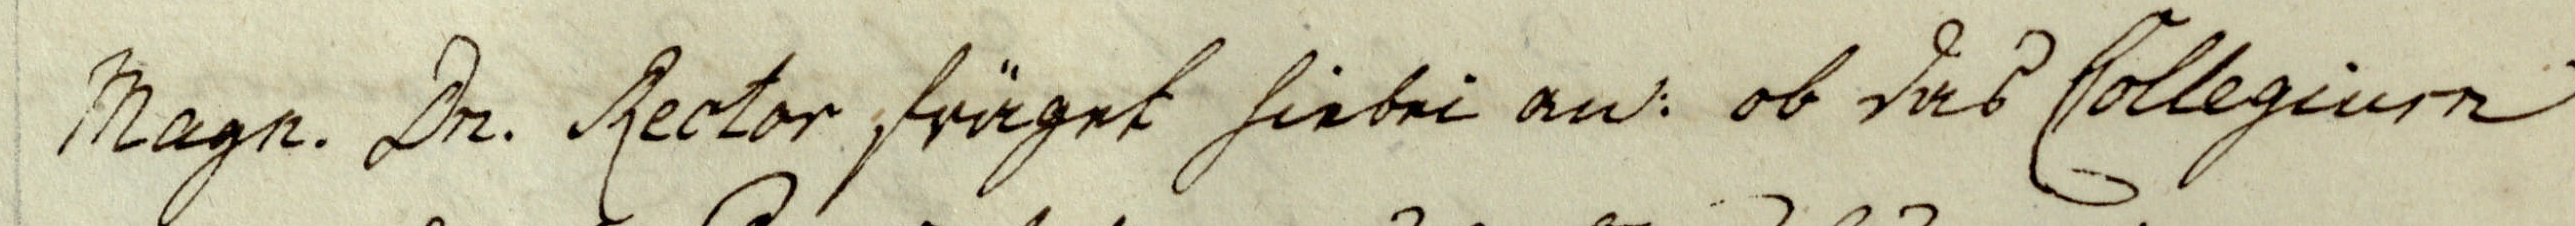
Magn. Dn. Rector fräget hiebei an: ob das Collegium
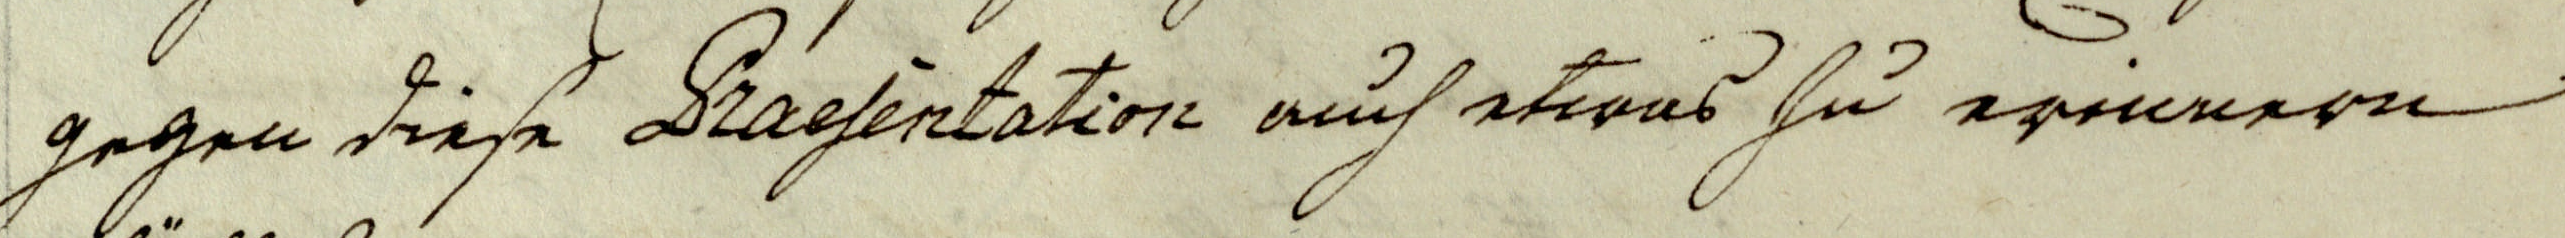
gegen diese Praesentation auch etwas zu erinnern
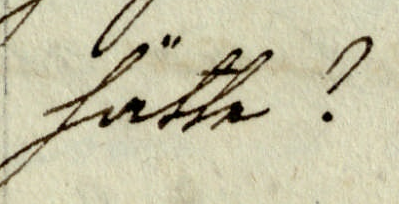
hätte?
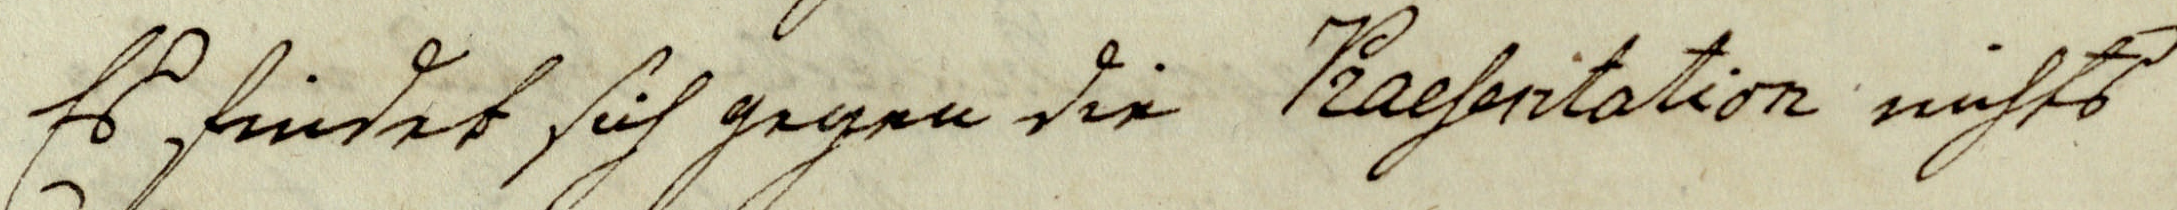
Es findet sich gegen die Praesentation nichts
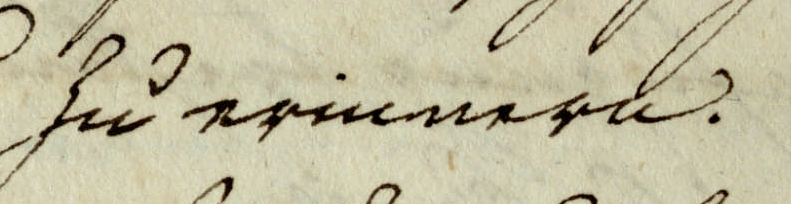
zu erinnern.
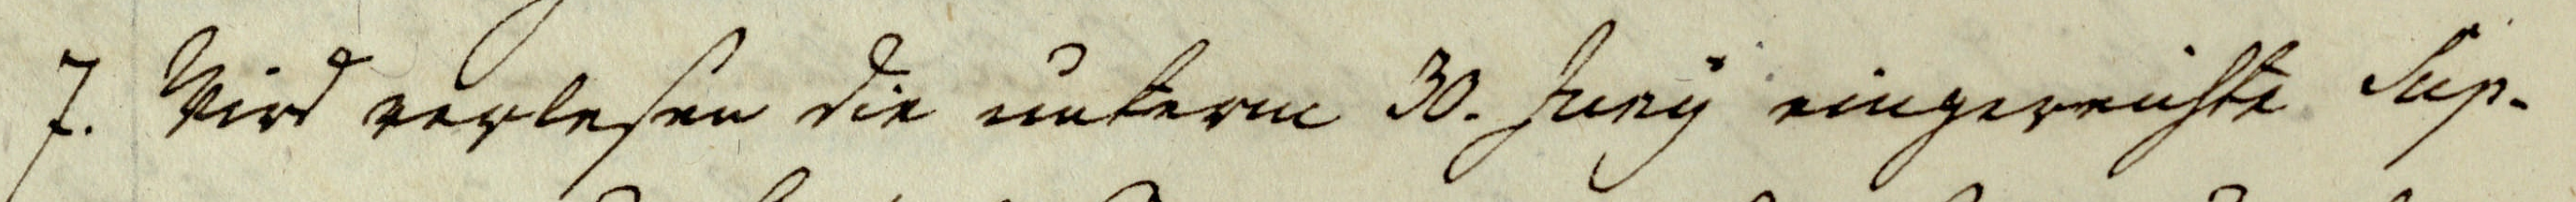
7. Wird verlesen die unterm 30. Junÿ eingereichte Sup¬
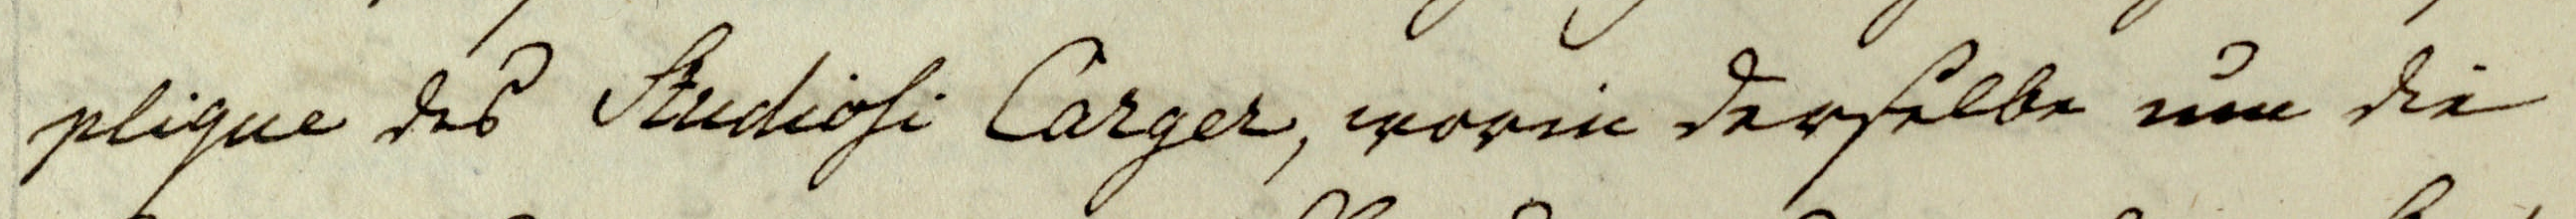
plique des Studiosi Carger, worin derselbe um die
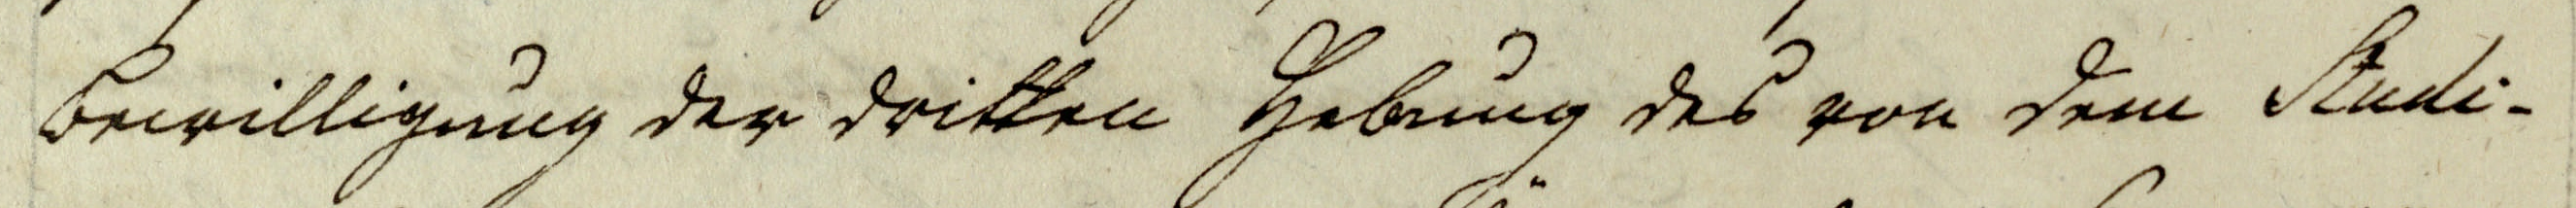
Bewilligung der dritten Hebung des von dem Studi¬
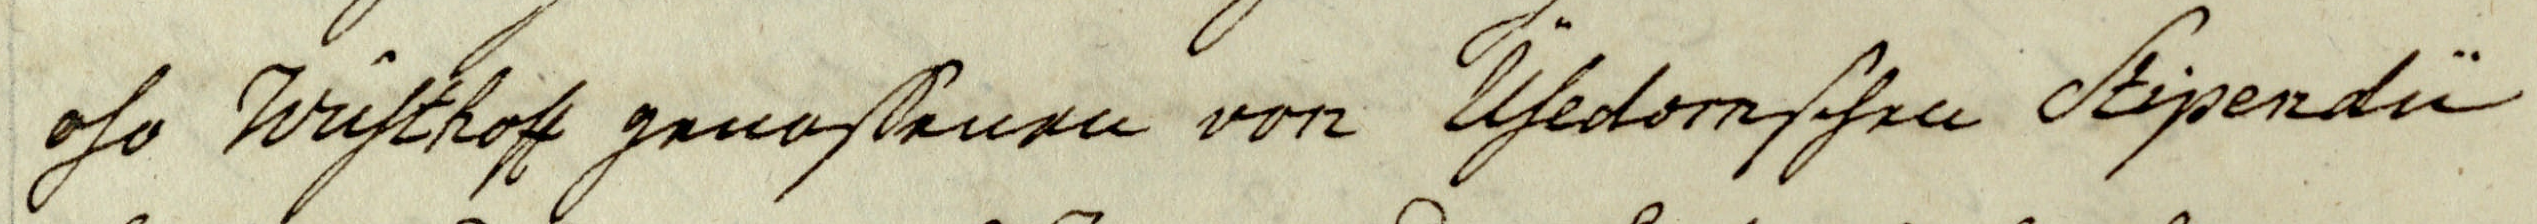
oso Wüsthoff genossenen von Usedomschen Stipendii
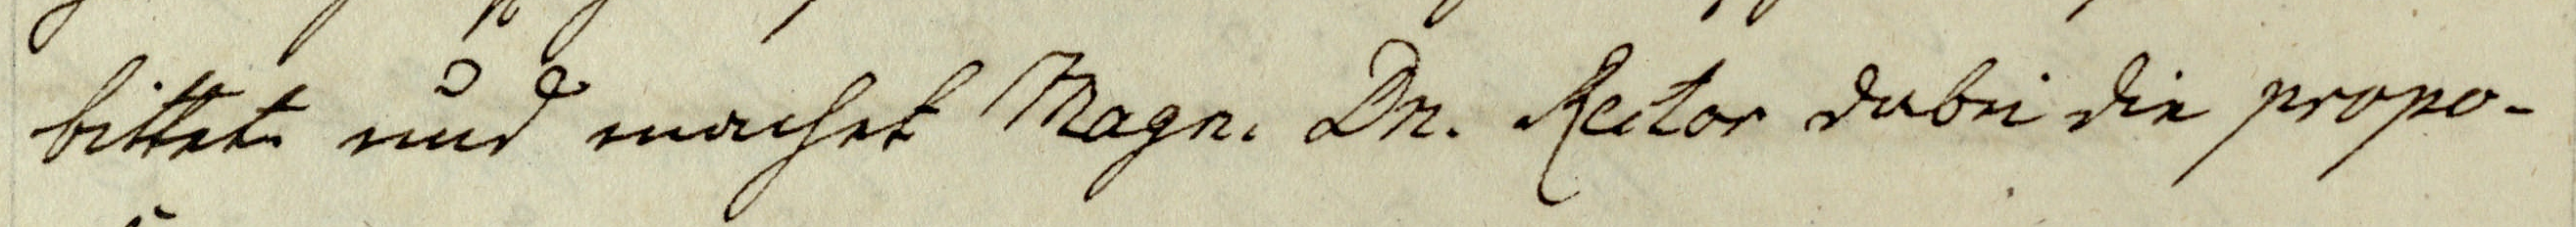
bittet und machet Magn. Dn. Rector dabei die propo¬
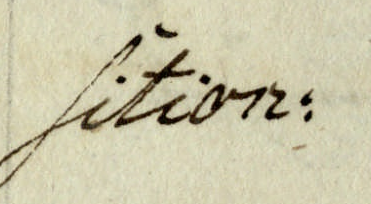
sition:
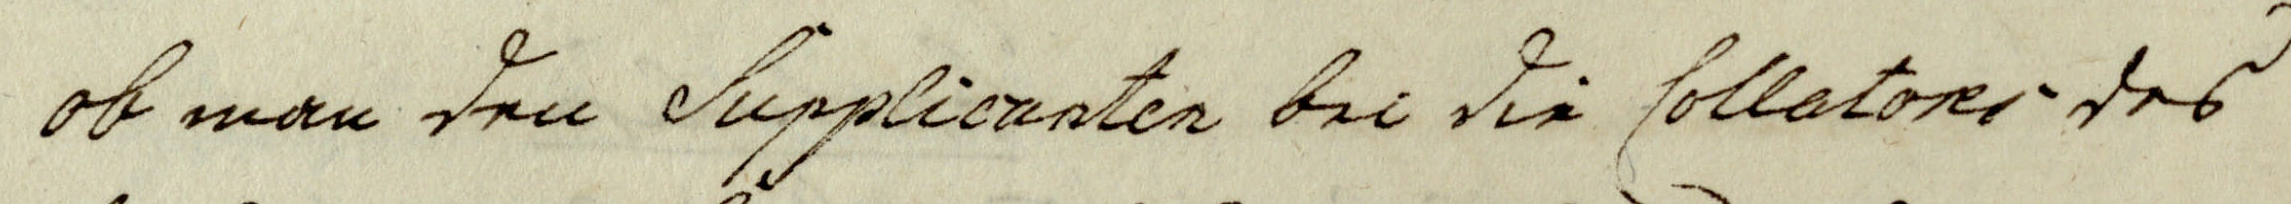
ob man den Supplicanten bei die Collatores des
